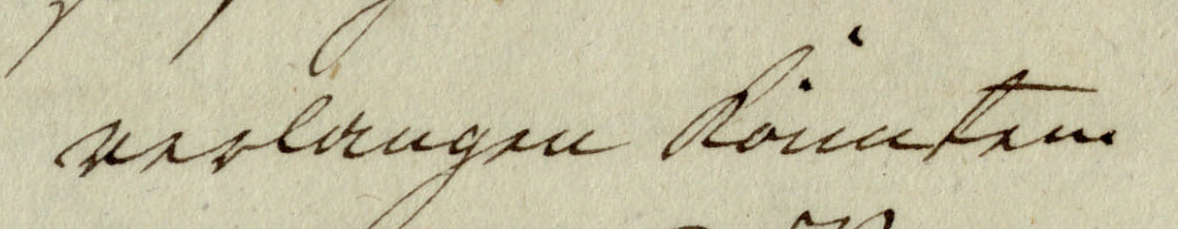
verlangen könnten.
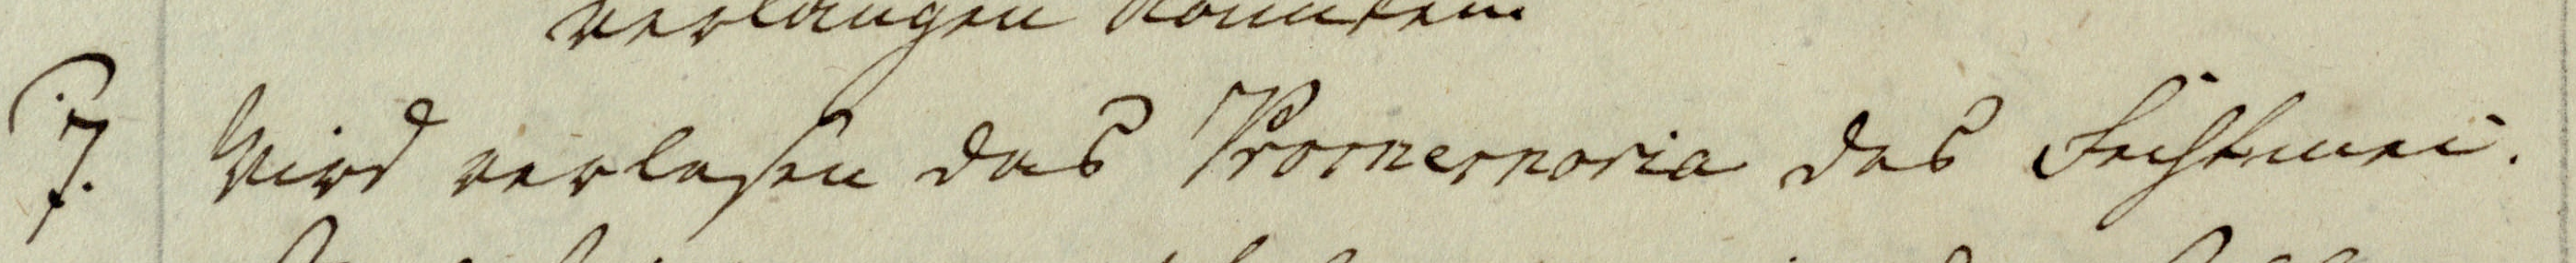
7. Wird verlesen das Promemoria des Fechtmei¬
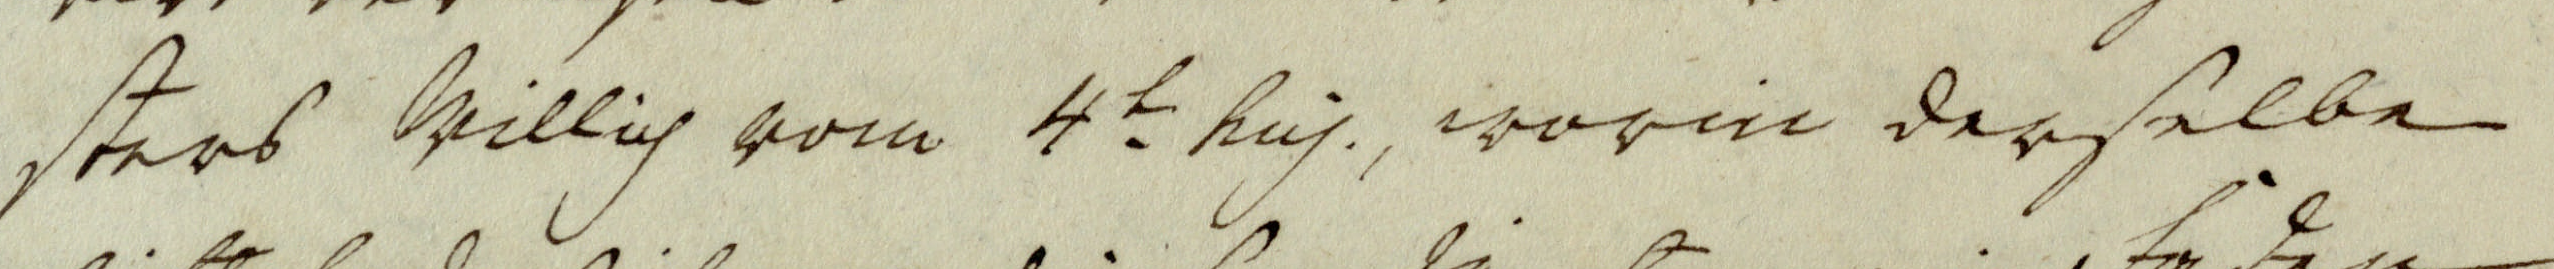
sters Willich vom 4 t huj., worin derselbe
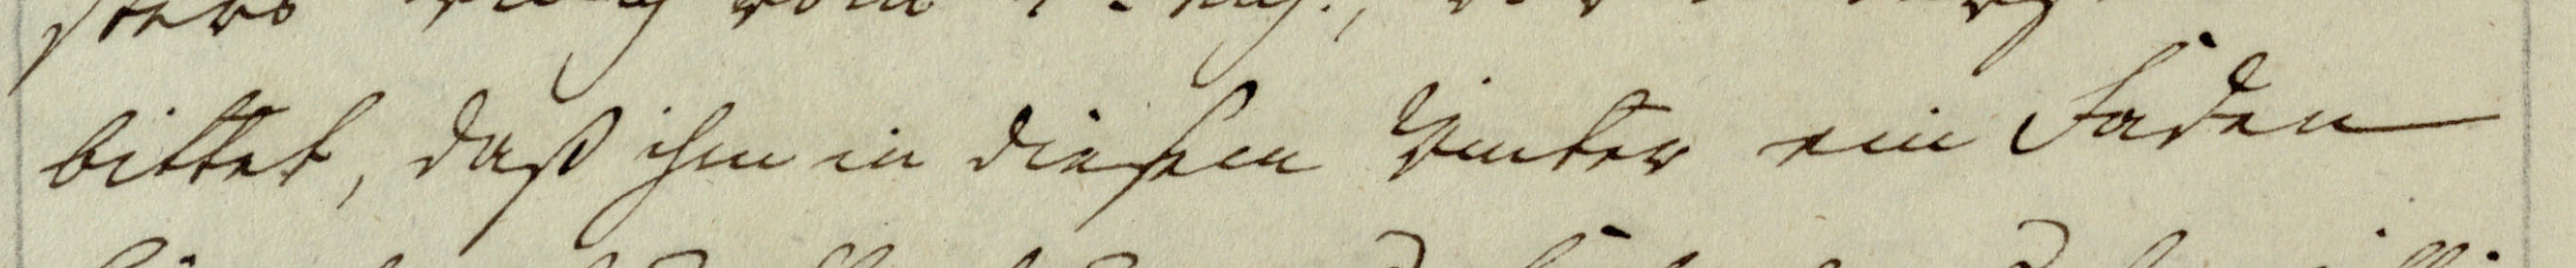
bittet, daß ihm in diesem Winter ein Faden
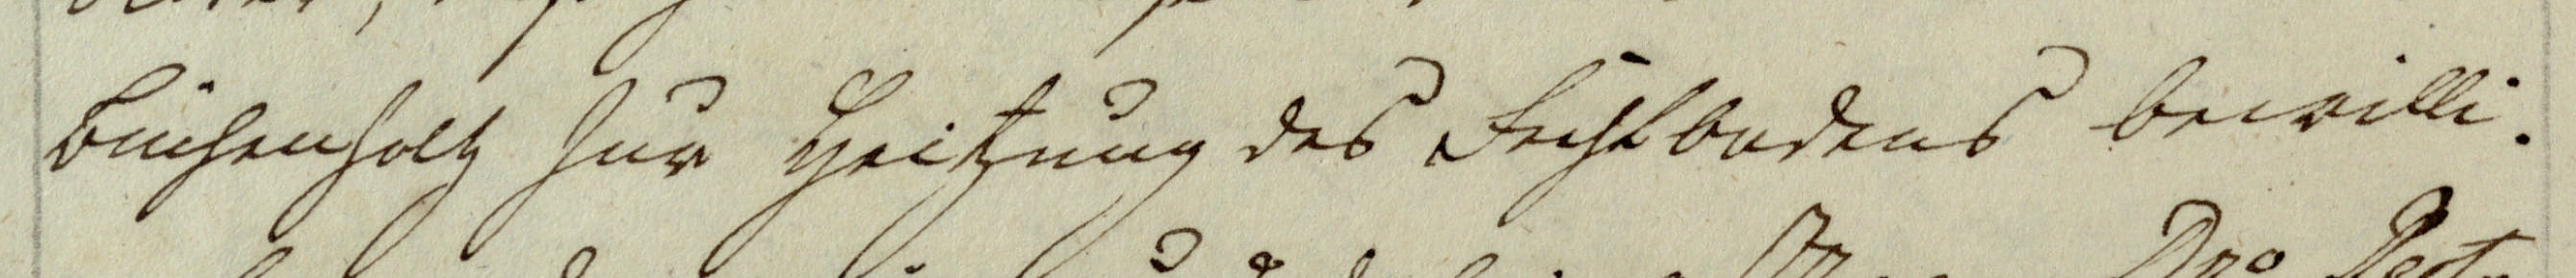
Büchenholz zur Heitzung des Fechtbodens bewilli¬
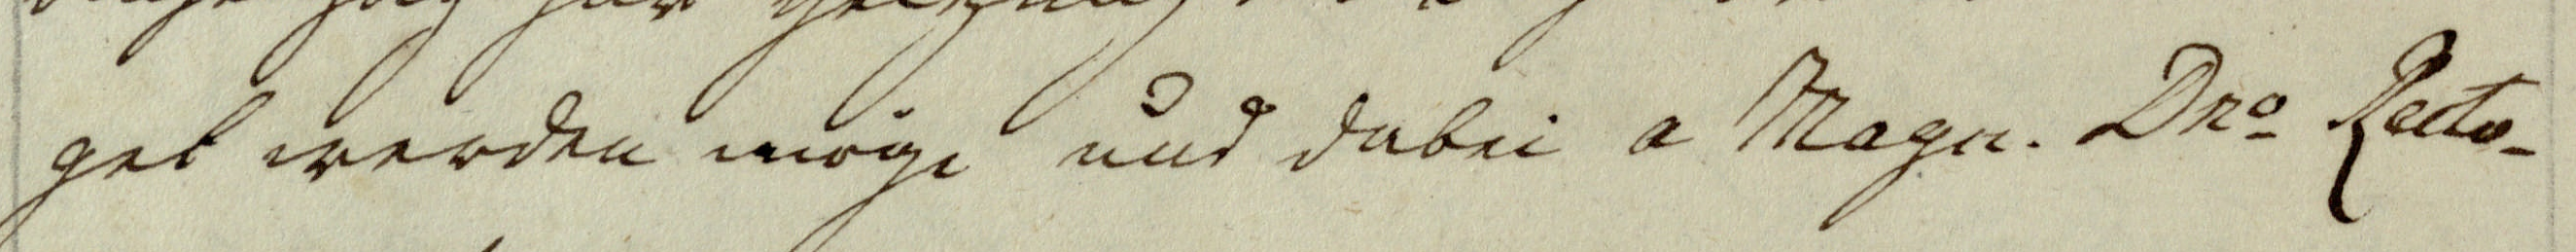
get werden möge und dabei a Magn. Dn. Recto¬
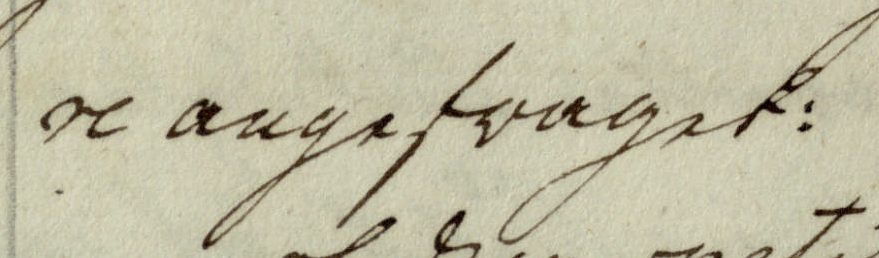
re angefraget:
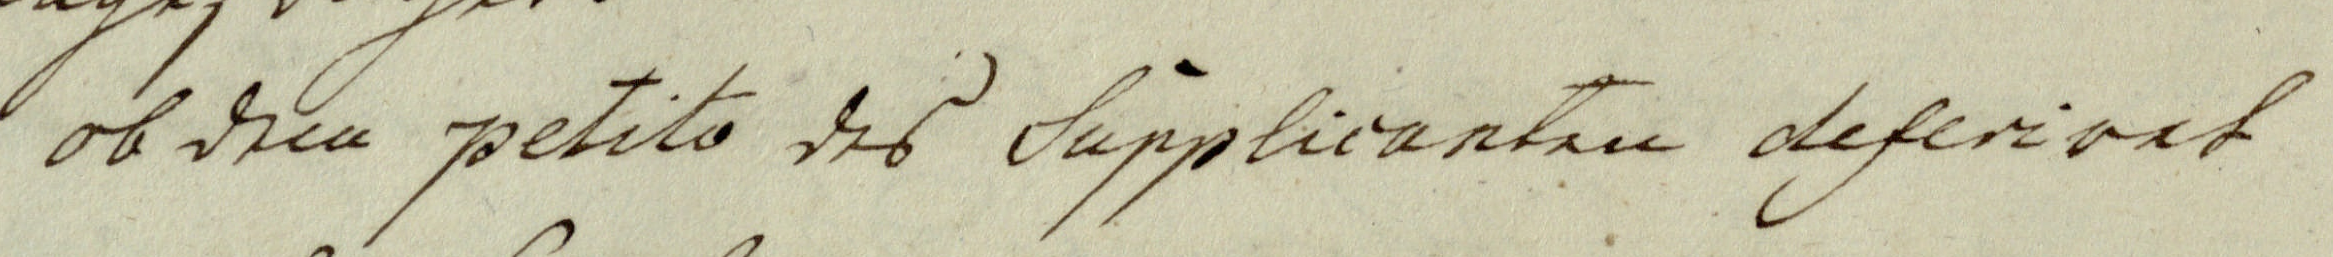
ob dem petito des Supplicanten deferiret
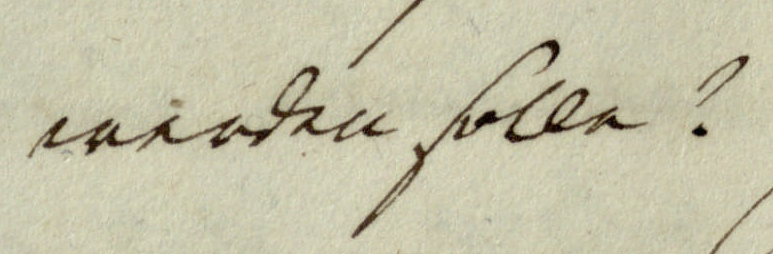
werden solle?
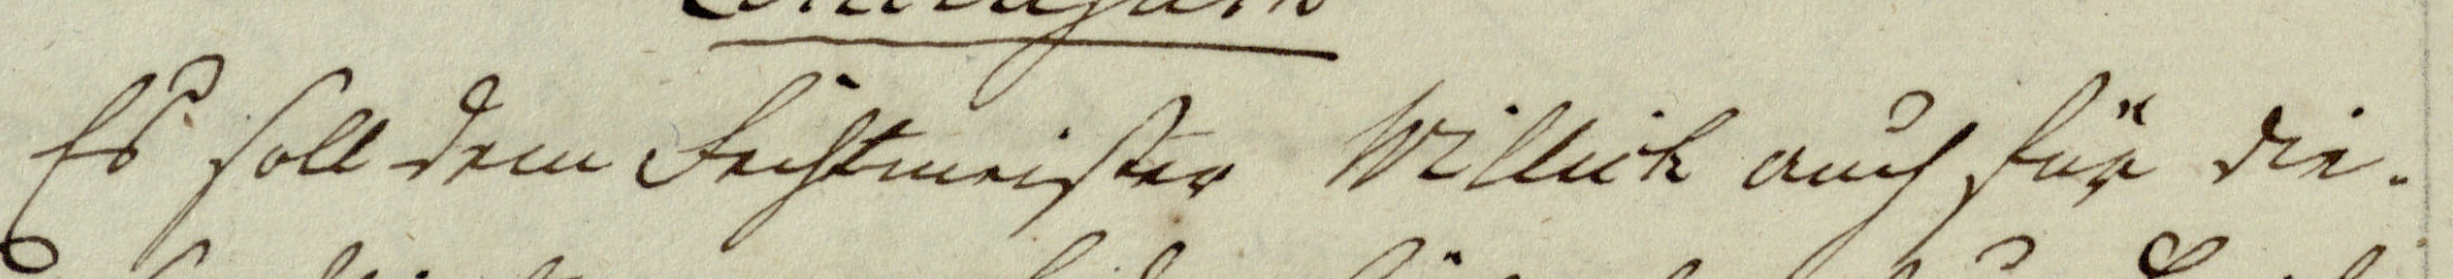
Es soll dem Fechtmeister Willich auch für die¬
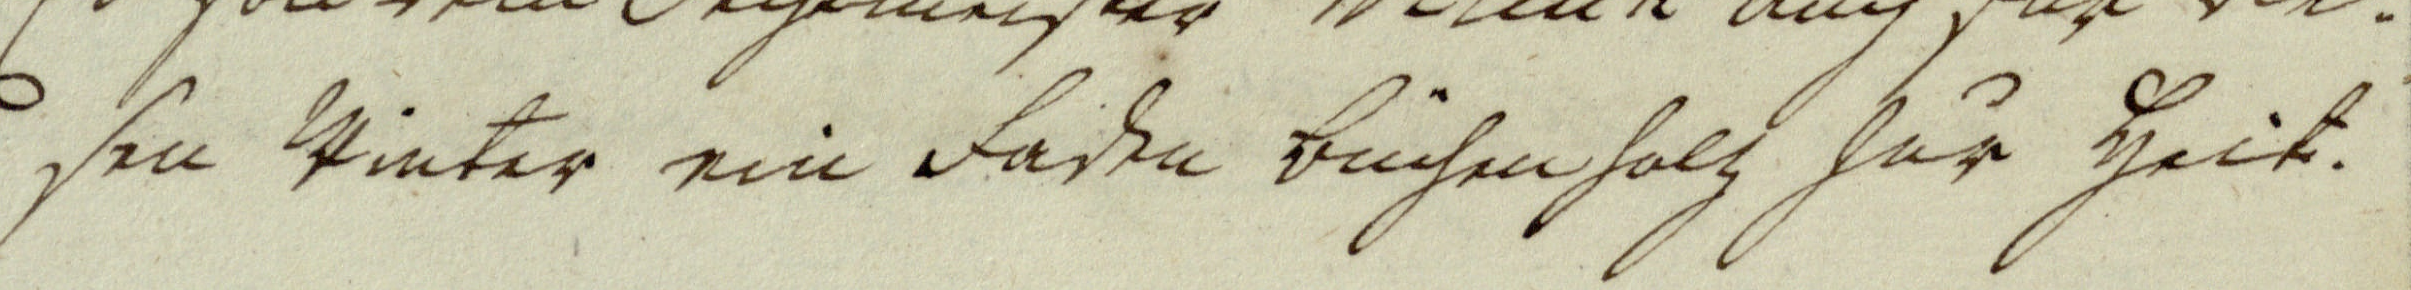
sen Winter ein Faden Büchenholz zur Heit¬
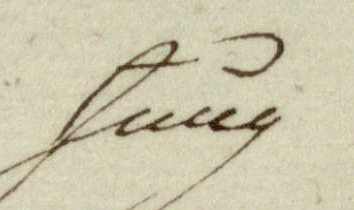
zung
